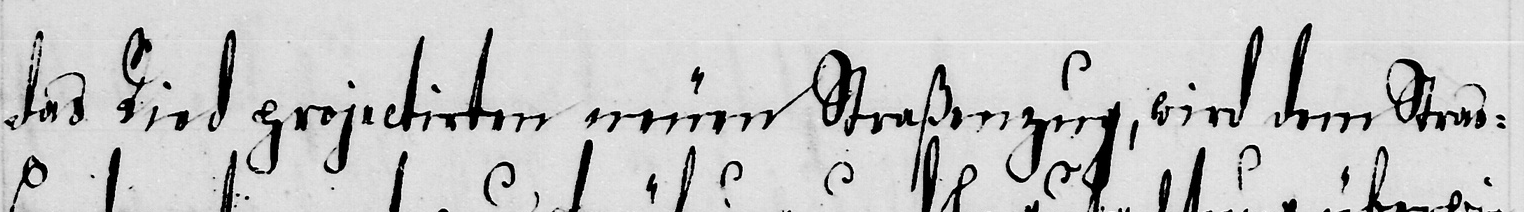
das Ried projectirten neuen Straßenzug, wird dem Straß¬
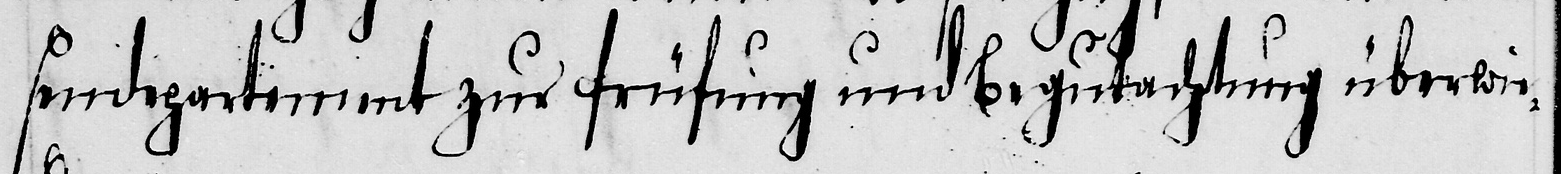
endepartement zur Prüfung und Begutachtung überwie¬
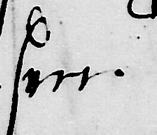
sen.
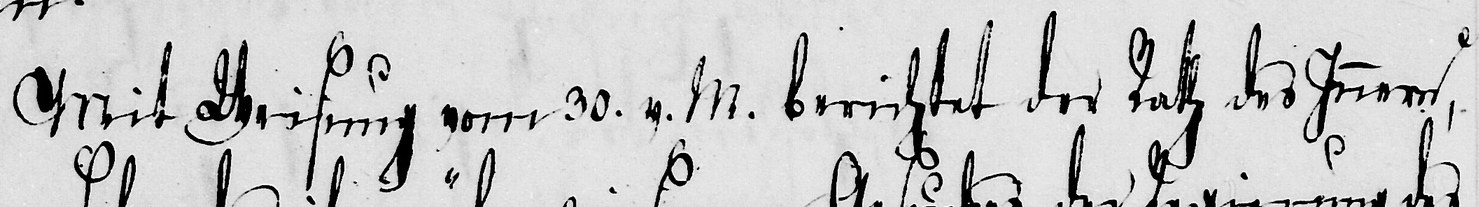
Mit Weisung vom 30. v. M. berichtet der Rath des Inner¬
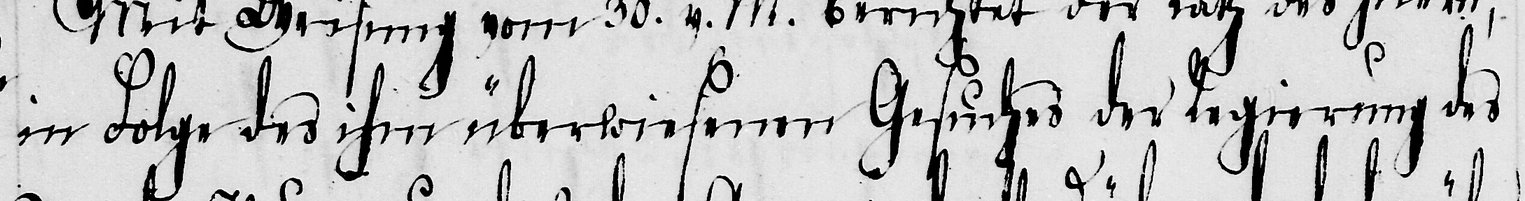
in Folge des ihm überwiesenen Gesuches der Regierung des
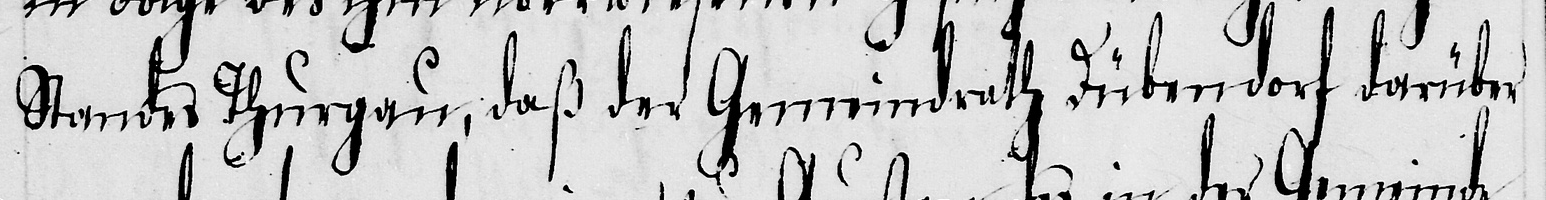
Standes Thurgau, daß der Gemeindrath Dübendorf darüber
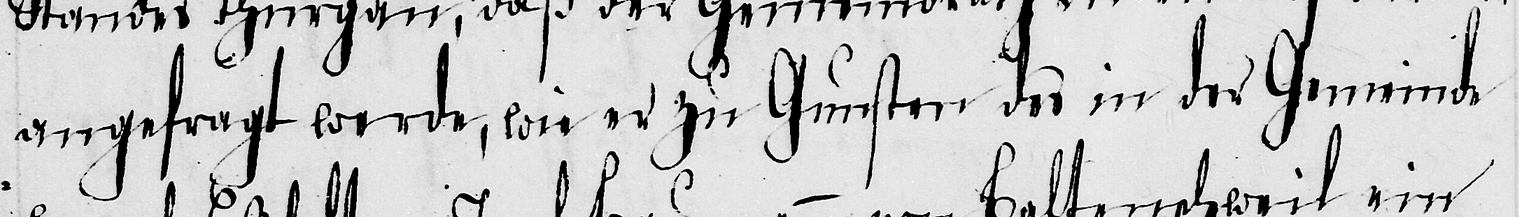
angefragt werde, wie er zu Gunsten des in der Gemeinde
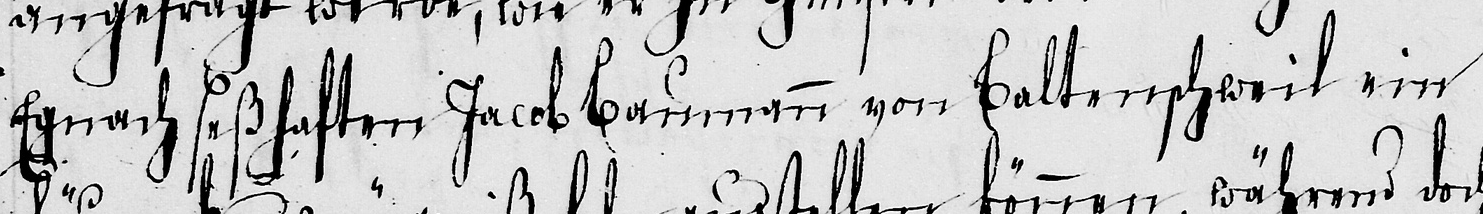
Egnach seßhaften Jacob Baumann von Baltenschweil ein
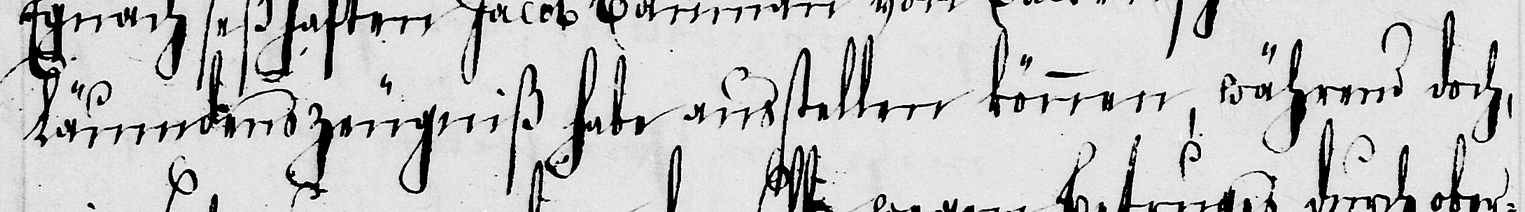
Läumdenszeugniß habe ausstellen können, während doch,
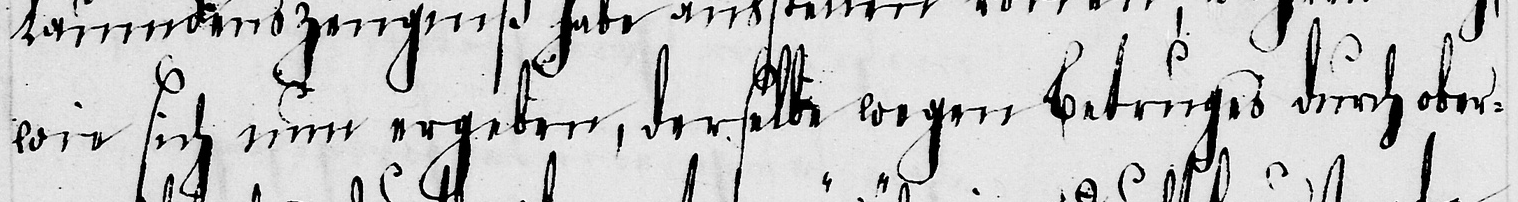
wie sich nun ergeben, derselbe wegen Betruges durch ober¬
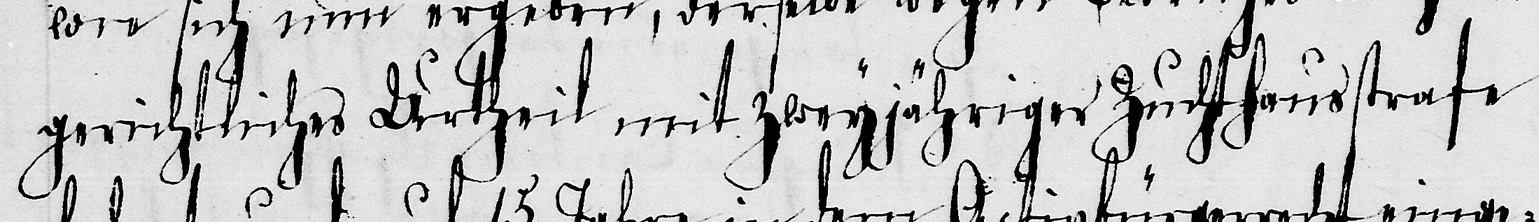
gerichtliches Urtheil mit zweyjähriger Zuchthausstrafe
